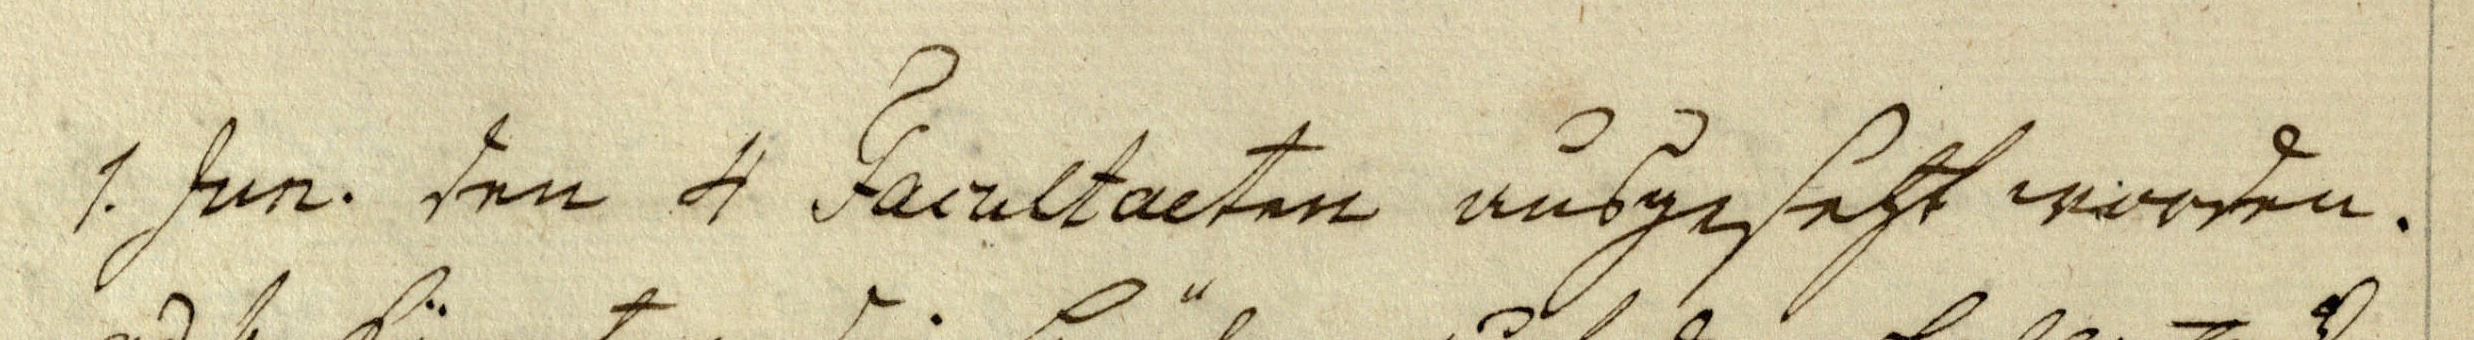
1. Jun. den 4 Facultaeten ausgesetzt worden.
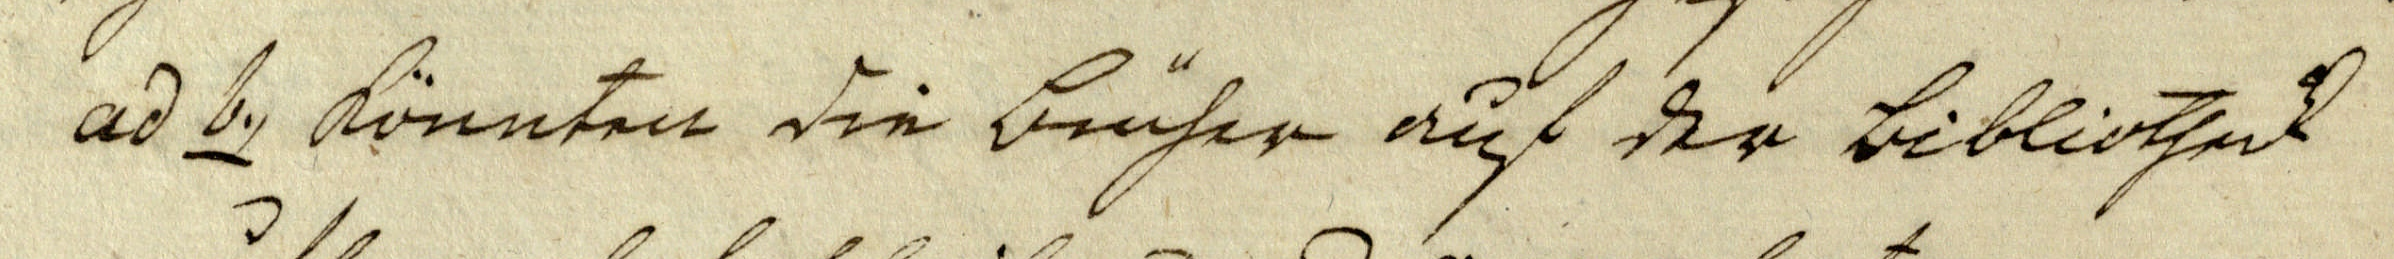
ad b., könnten die Bücher auf der Bibliotheck
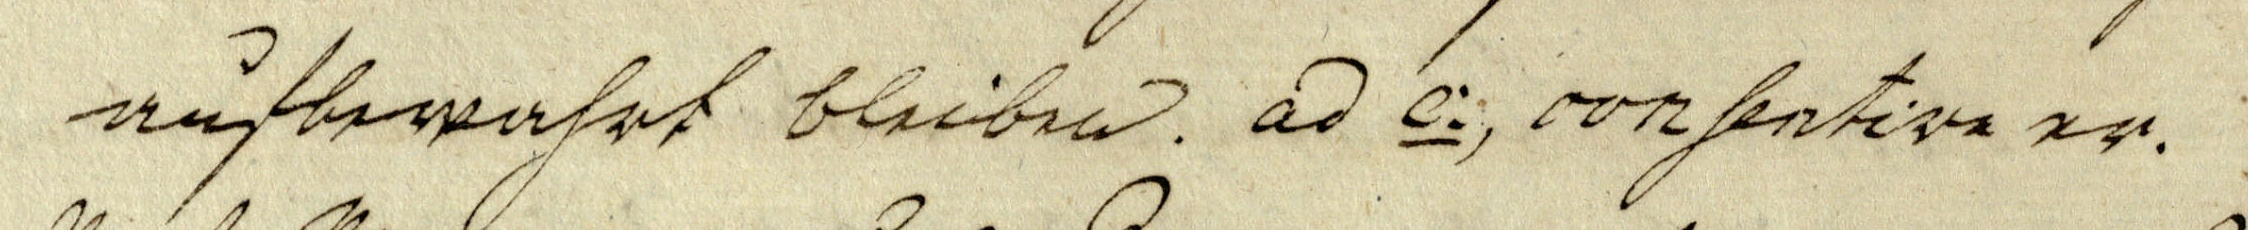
aufbewahrt bleiben. ad c., consentire er.
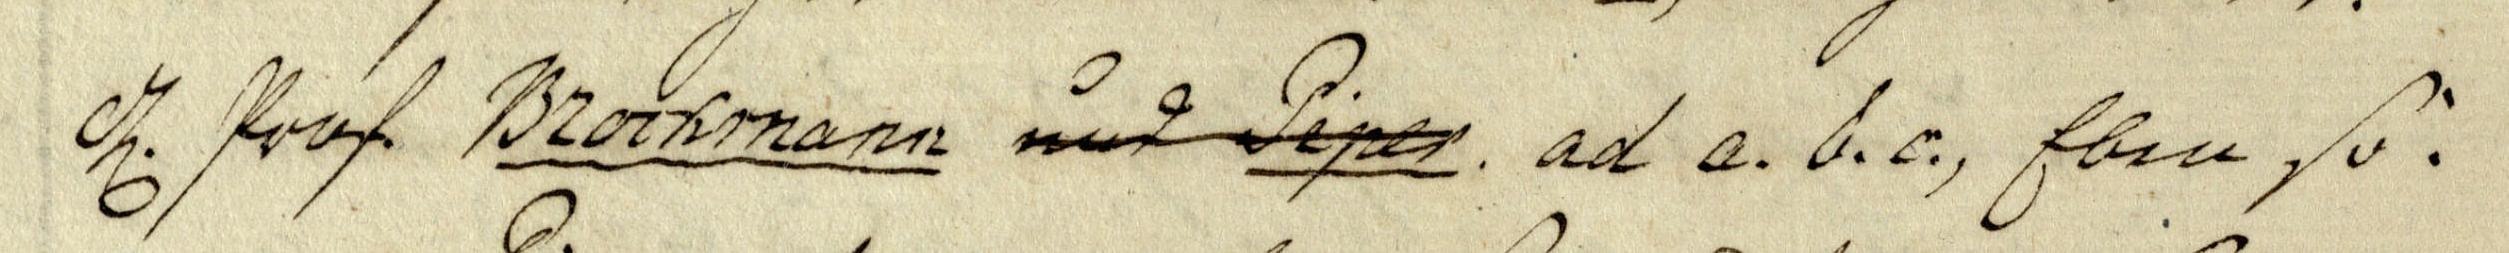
dh. Prof. Brockmann und Piper ad a. b. c., Eben so.
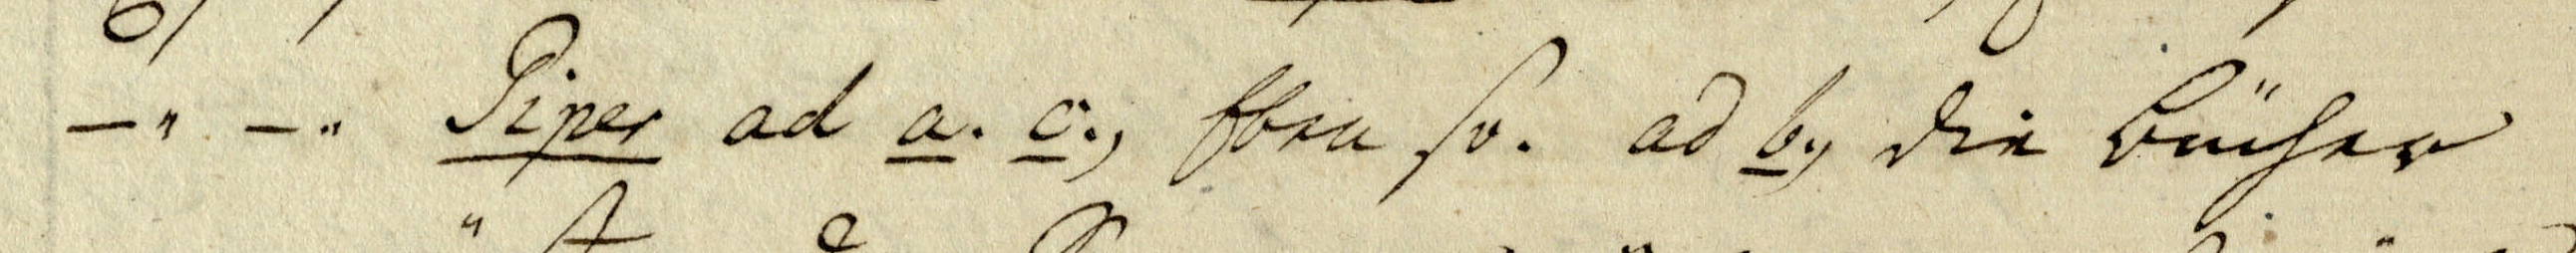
Piper ad a. c., Eben so. ad b. die Bücher
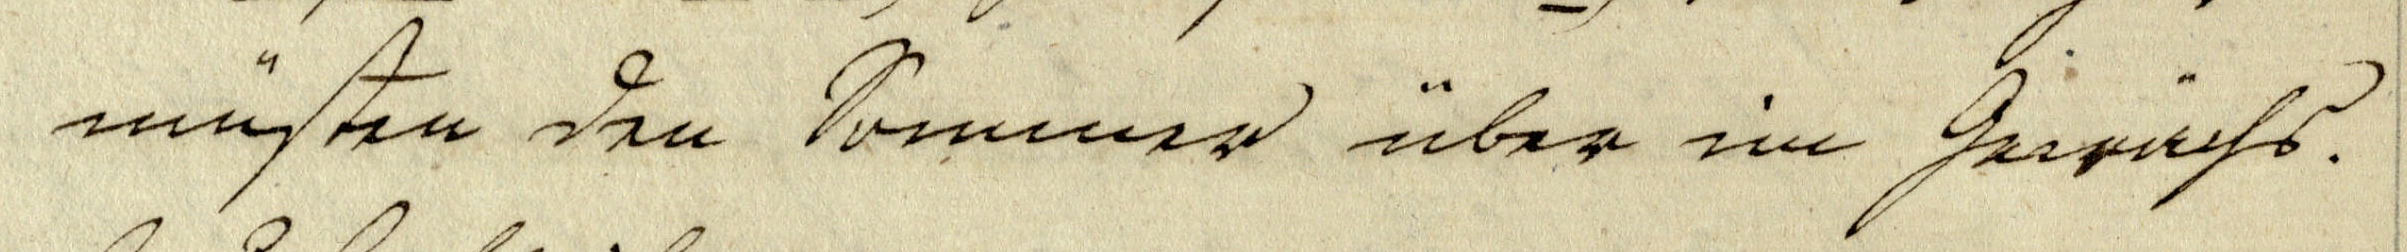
müßten den Sommer über im Gewächs¬
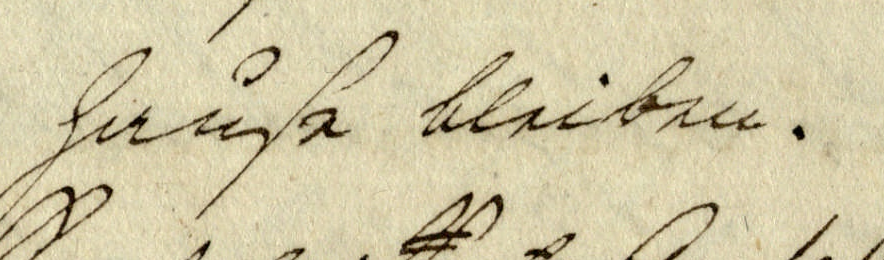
hause bleiben.
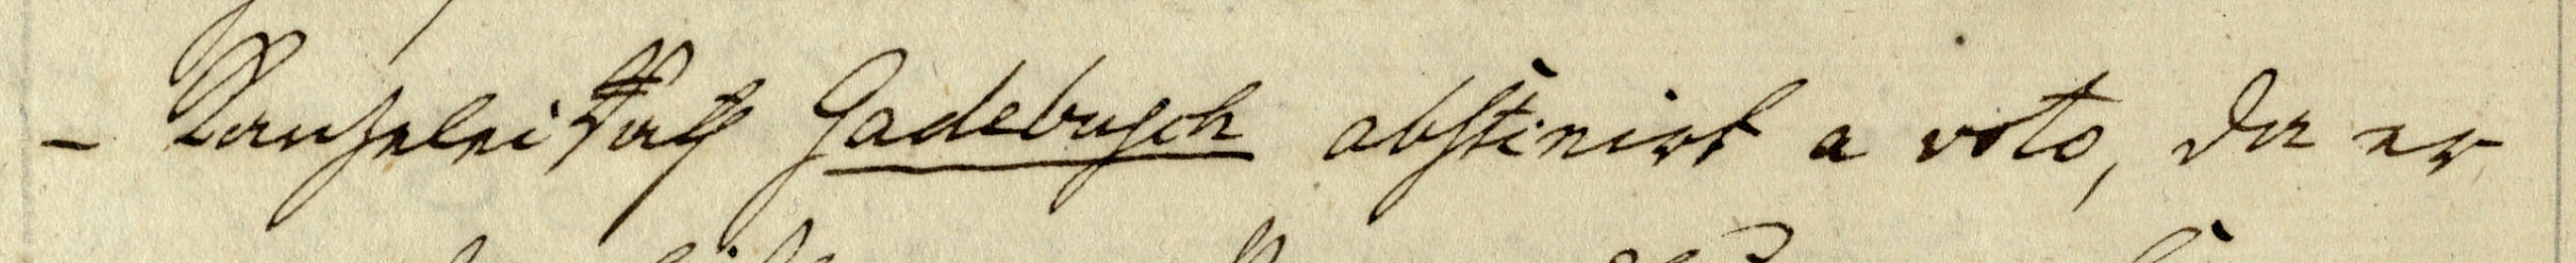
Kanzelei Rath Gadebusch abstinirt a voto, da er
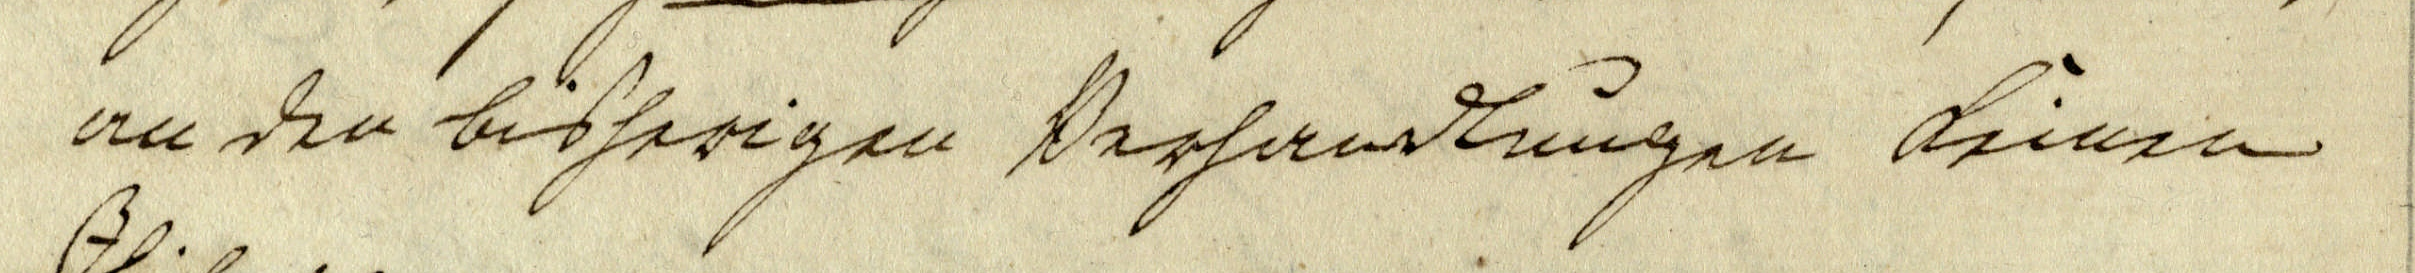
an den bisherigen Verhandlungen keinen
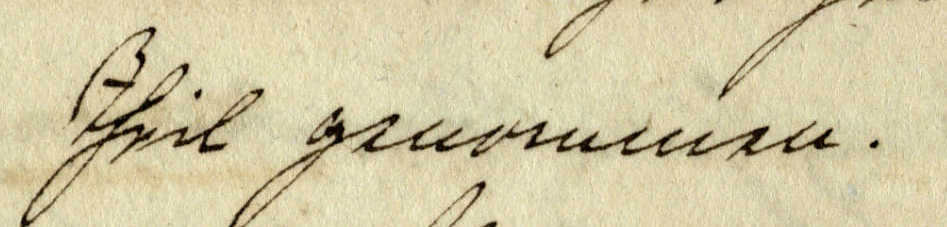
Theil genommen.
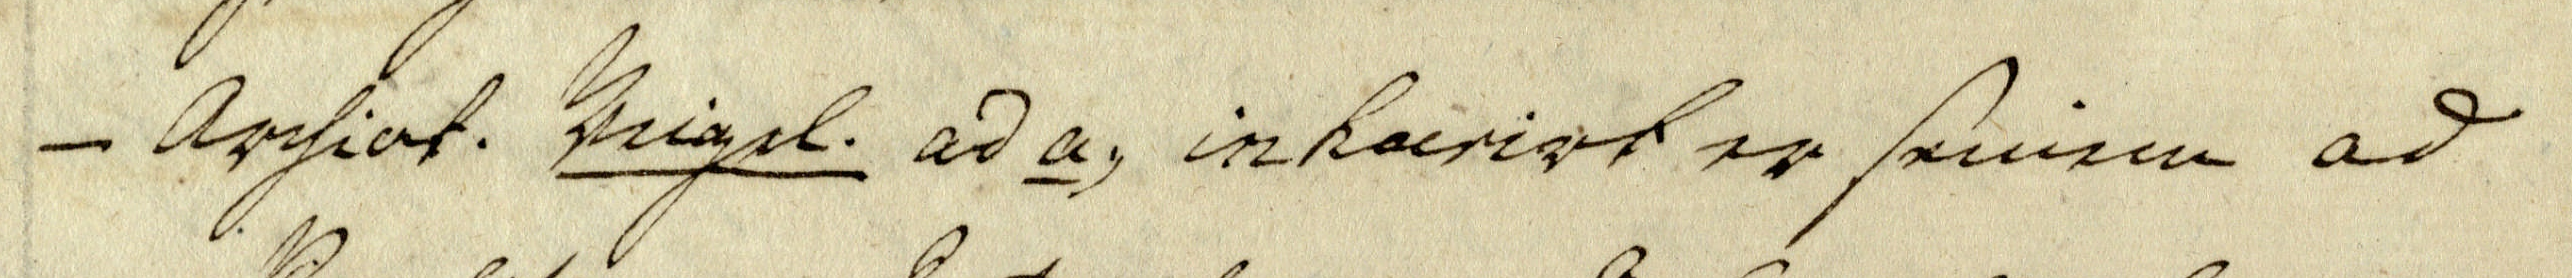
Archiat. Weigel. ad a. inhaerirt er seinem ad
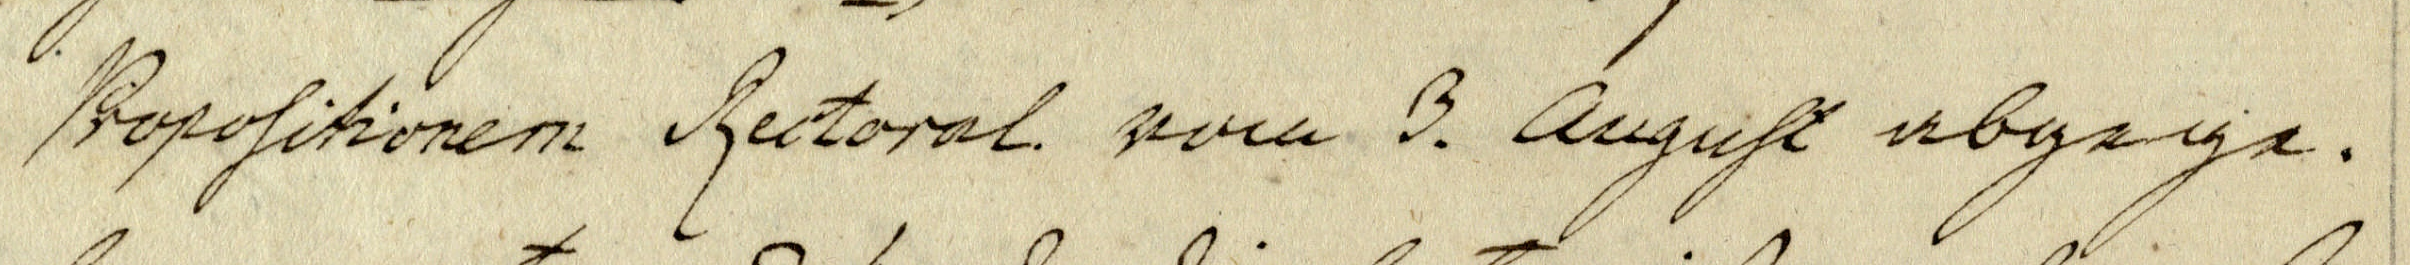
Propositionem Rectoral. vom 3. August abgege¬
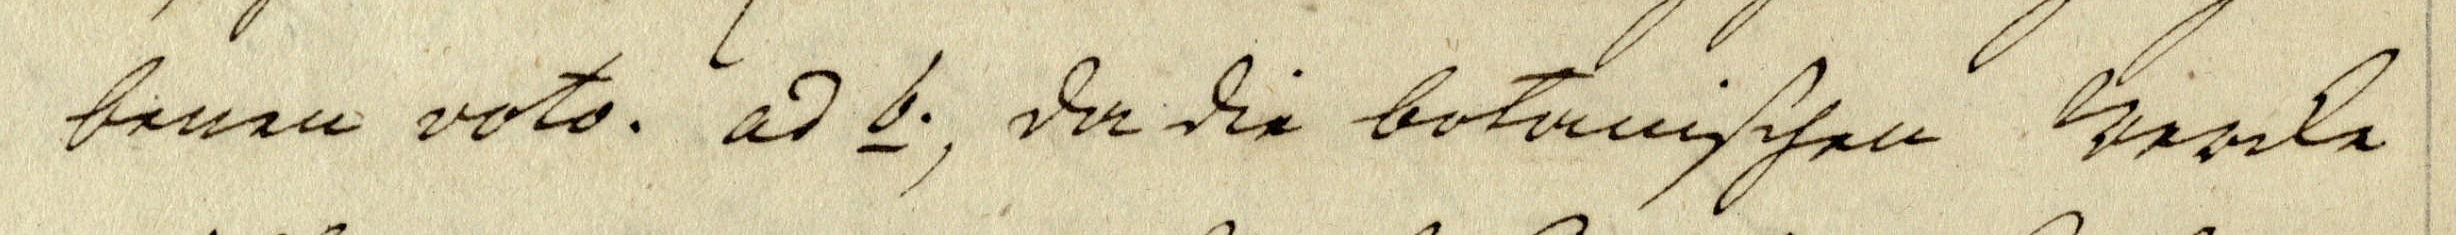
benen voto. ad b., da die botanischen Wercke
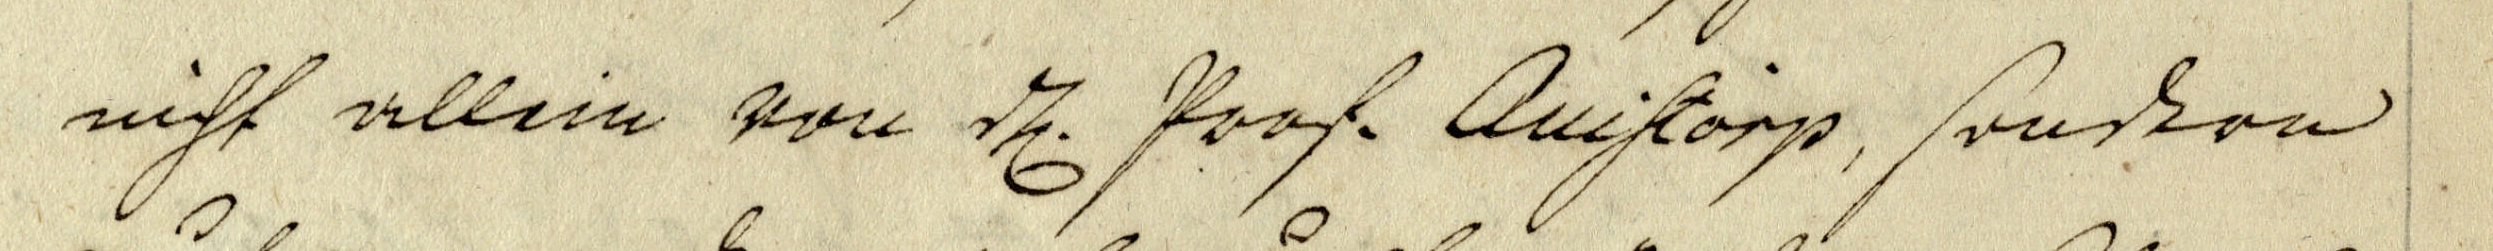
nicht allein von dh. Prof. Quistorp, sondern
